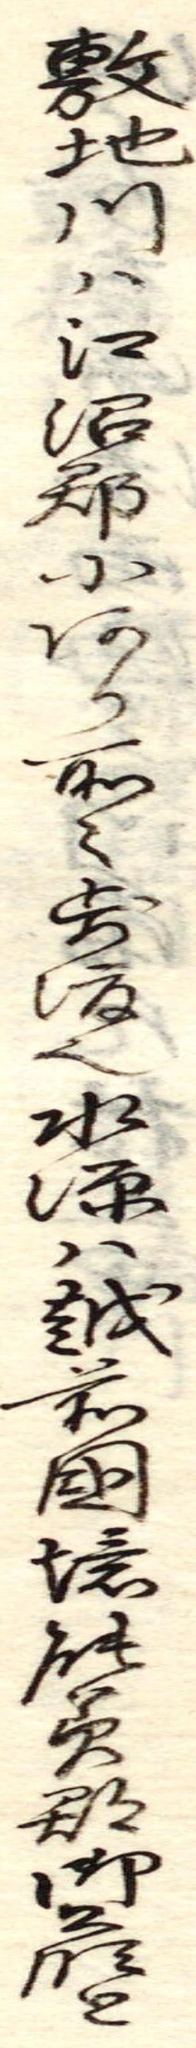敷地川は江沼郡にあり所々歩渡也水源は越前国境能美郡御公領と
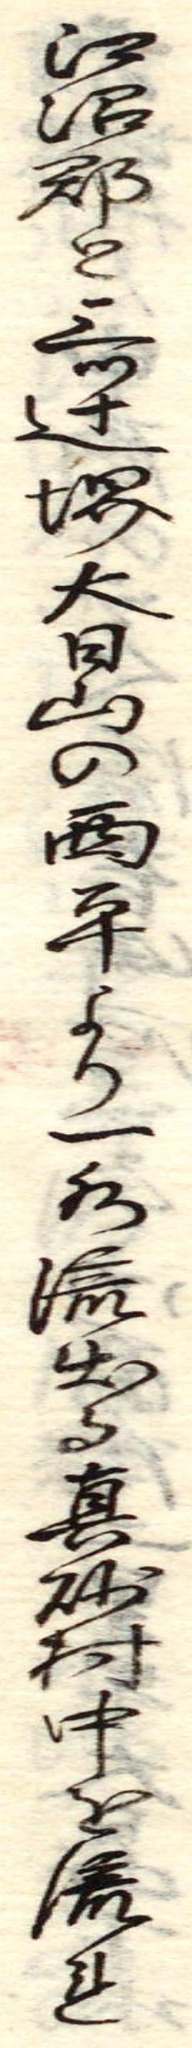江沼郡と三ツ辻堺大日山の西平より一水流出る真砂村中を流れ
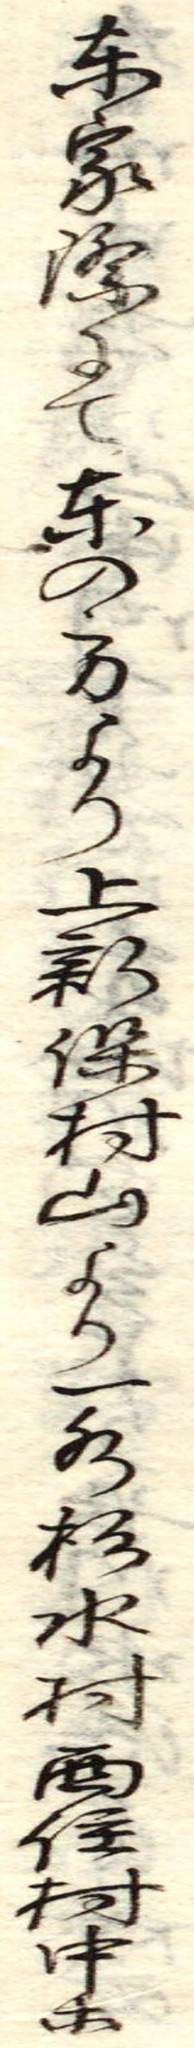東家際にて東の方より上新保村山より一水杉水村西住村中等
